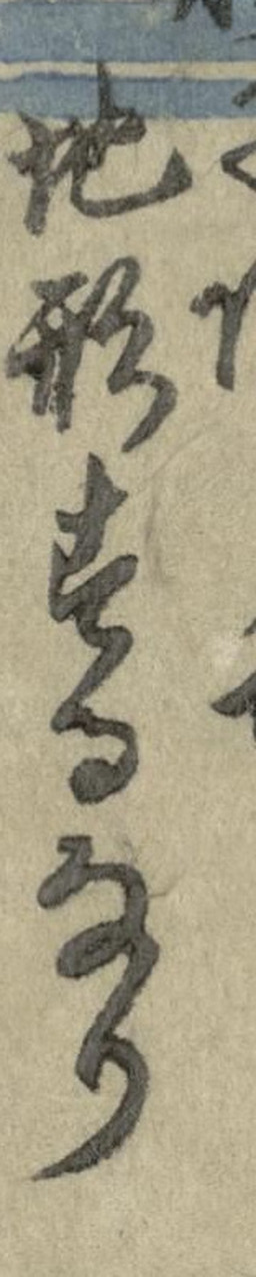地形するなり
